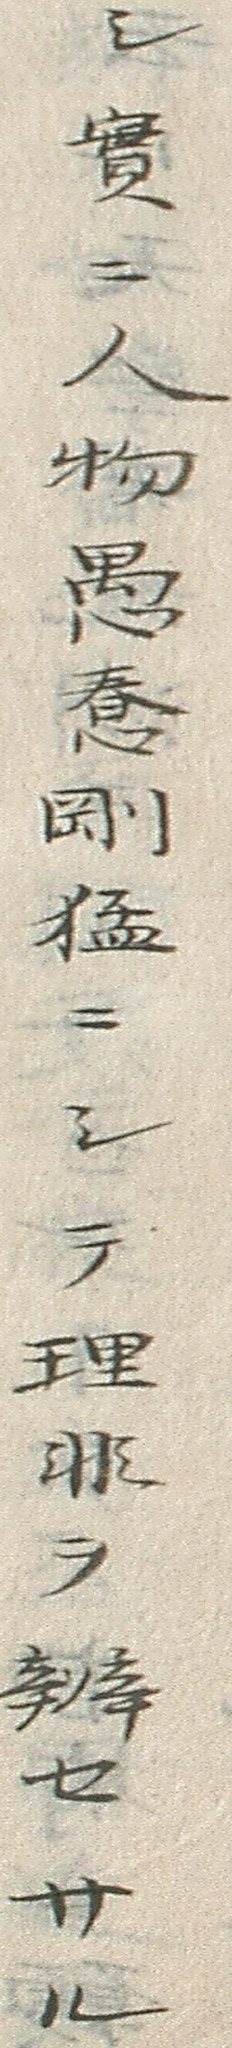シ実ニ人物愚憃剛猛ニシテ理非ヲ弁セサル
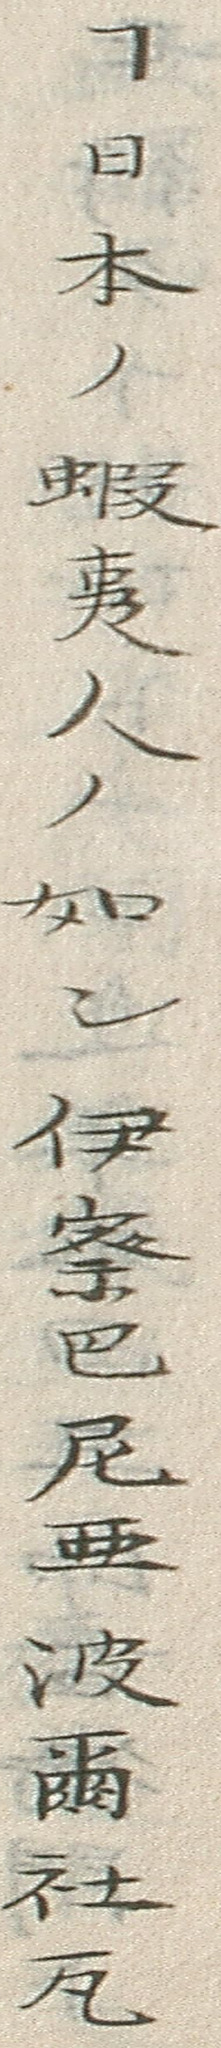コト日本ノ蝦夷人ノ如シ伊察巴尼亜波爾社瓦
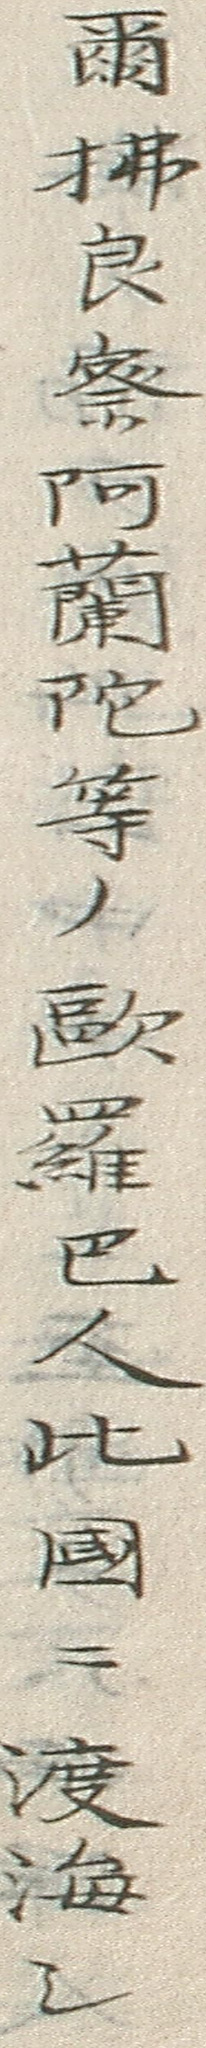爾拂良察阿蘭陀等ノ欧羅巴人此国ニ渡海シ
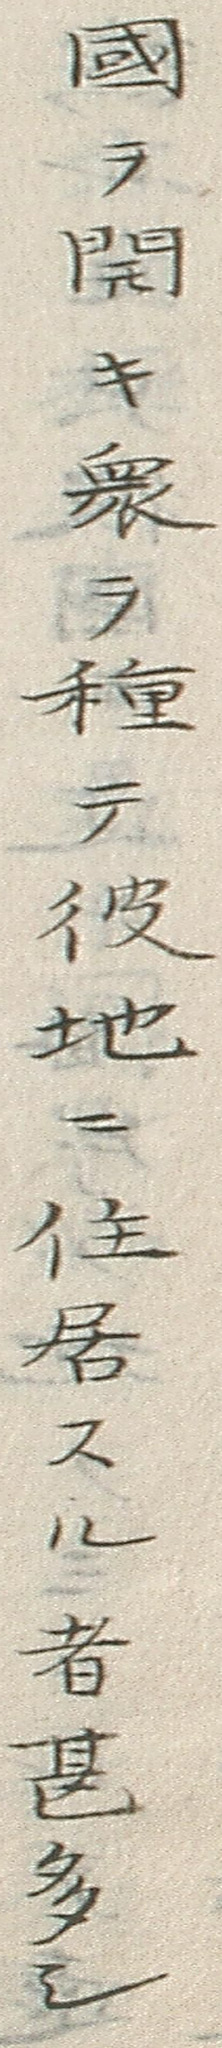国ヲ開キ衆ヲ種テ彼地ニ住居スル者甚多シ

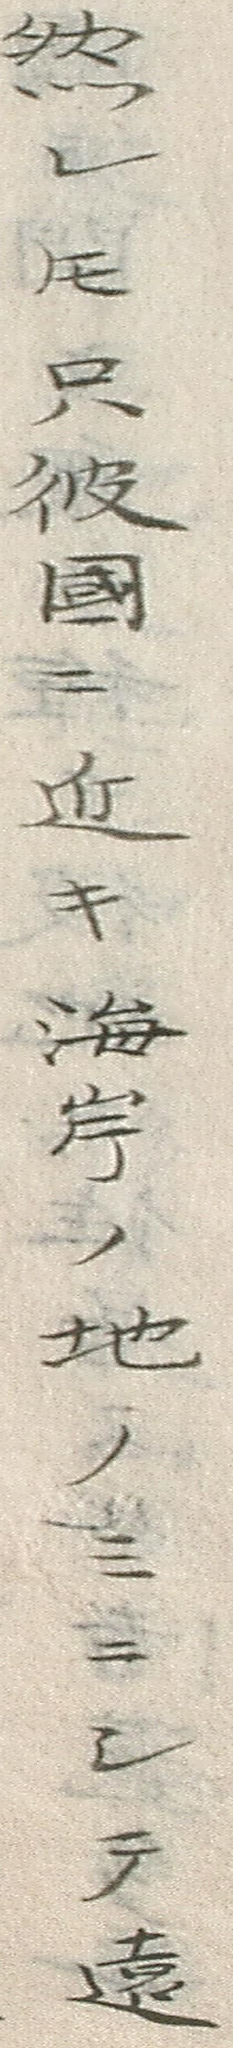然レトモ只彼国ニ近キ海岸ノ地ノミニシテ遠
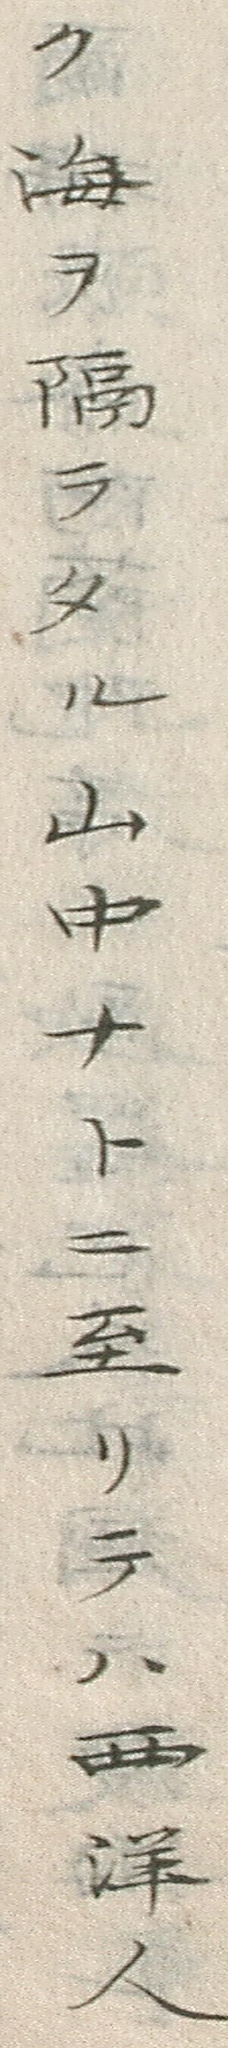ク海ヲ隔テタル山中ナトニ至リテハ西洋人
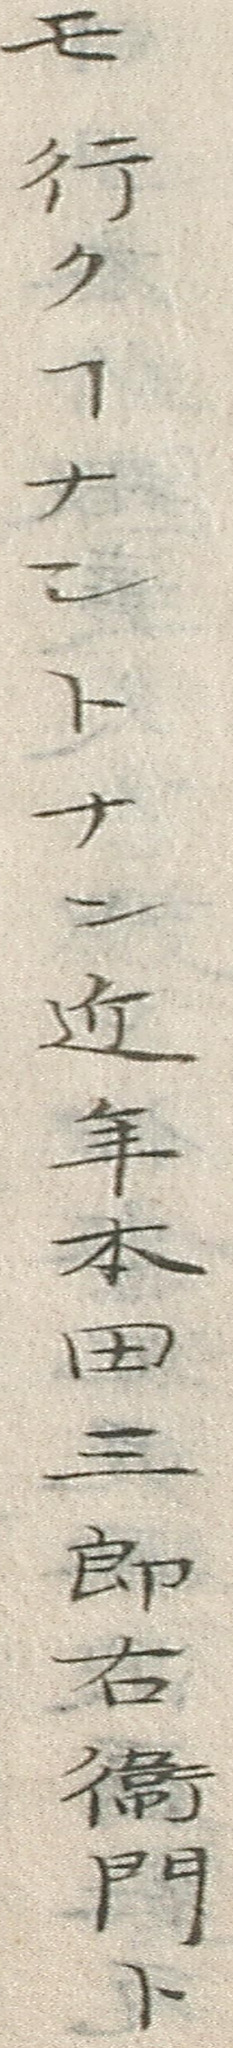モ行クコトナシトナン近年本田三郎右衛門ト
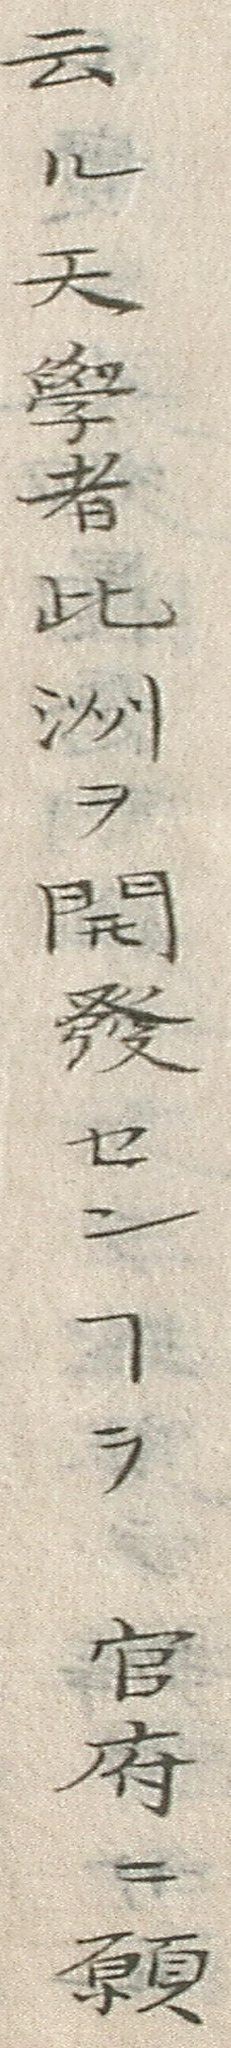云ル天学者此洲ヲ開発センコトヲ官府ニ願
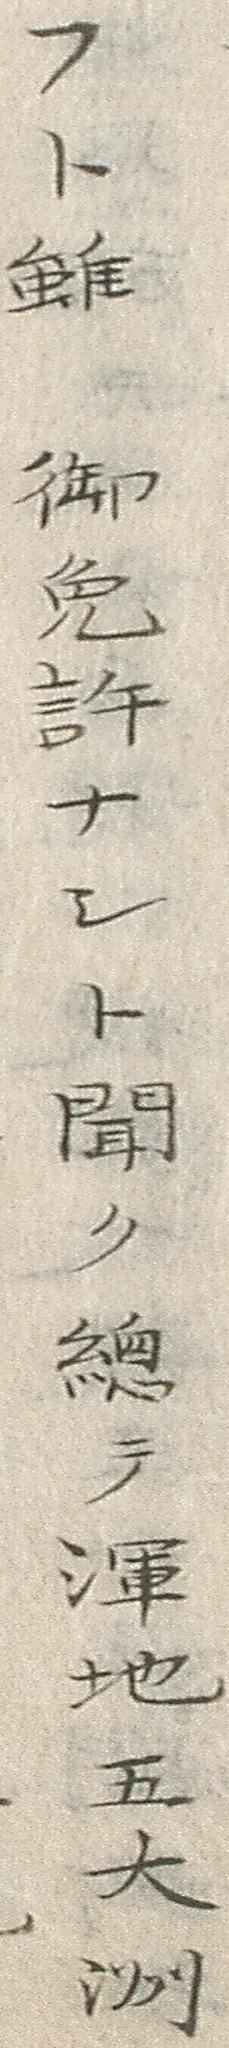フト雖御免許ナシト聞ク総テ渾地五大洲
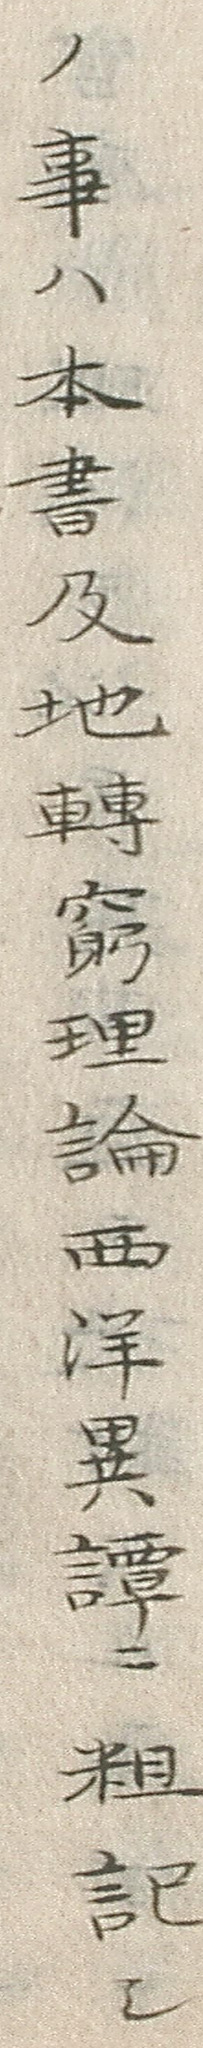ノ事ハ本書及地転窮理論西洋異譚ニ粗記シ
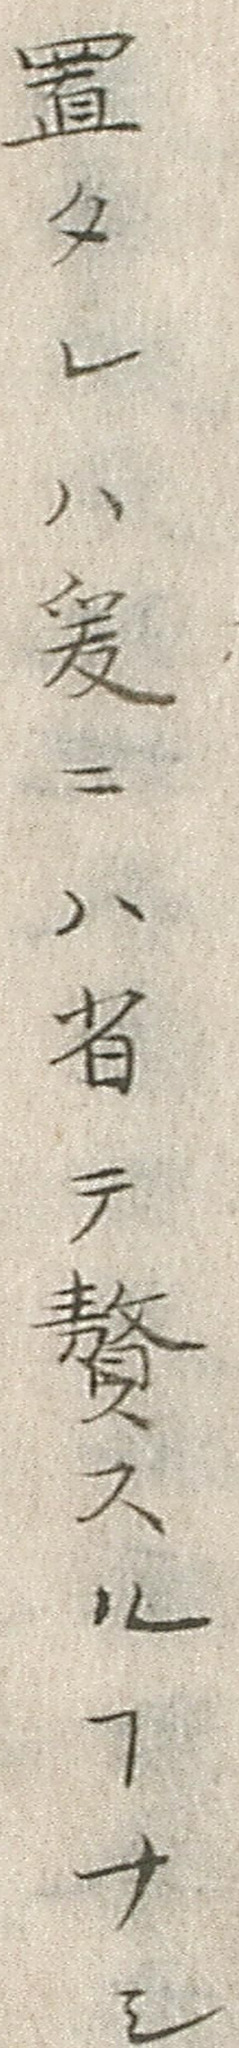置タレハ爰ニハ省テ贅スルコトナシ
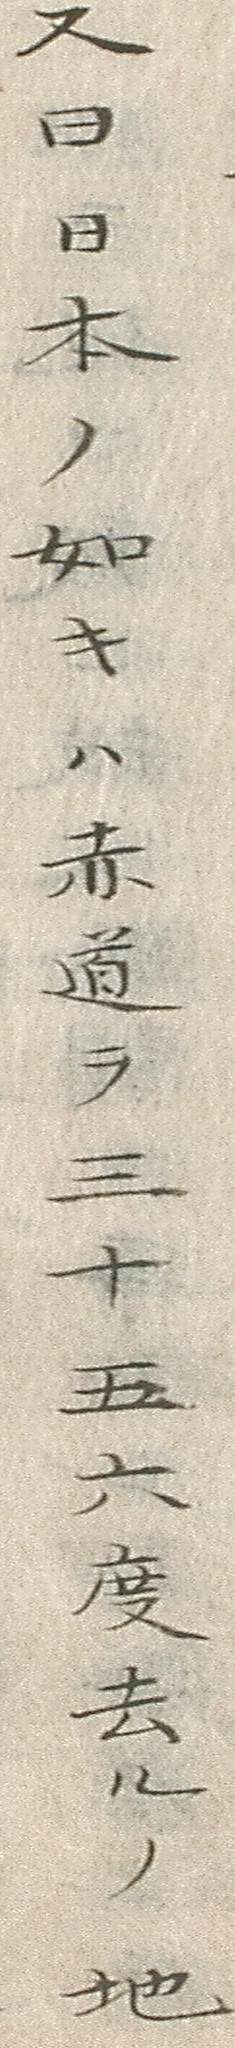又曰日本ノ如キハ赤道ヲ三十五六度去ルノ地
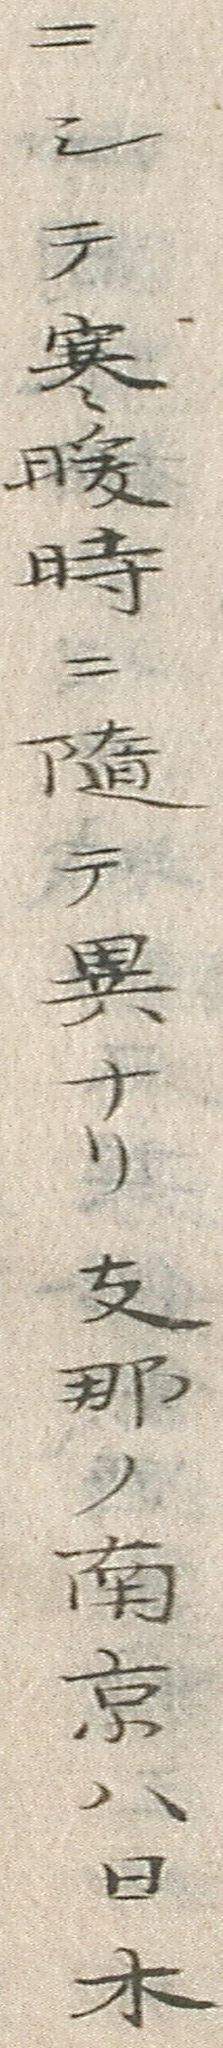ニシテ寒暖時ニ随テ異ナリ支那ノ南京ハ日木
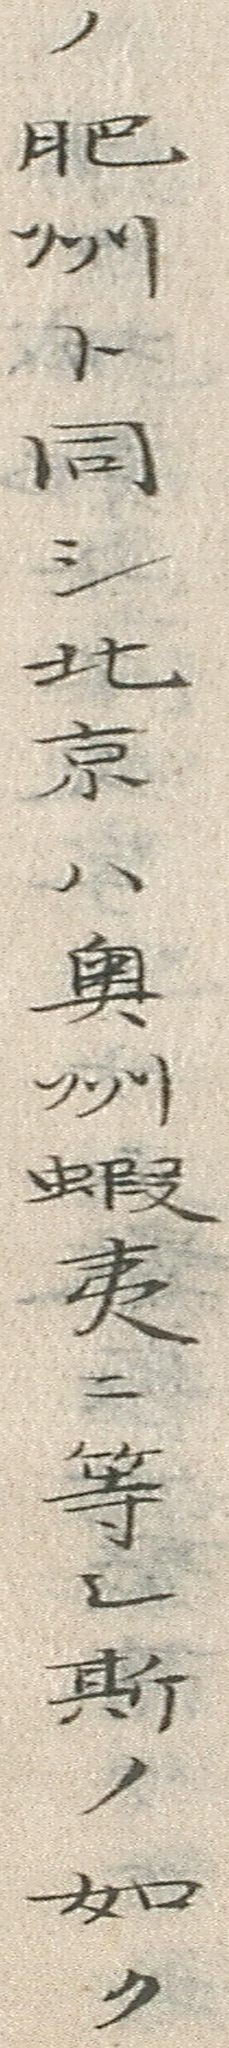ノ肥州ト同シ北京ハ奥州蝦夷ニ等シ斯ノ如ク
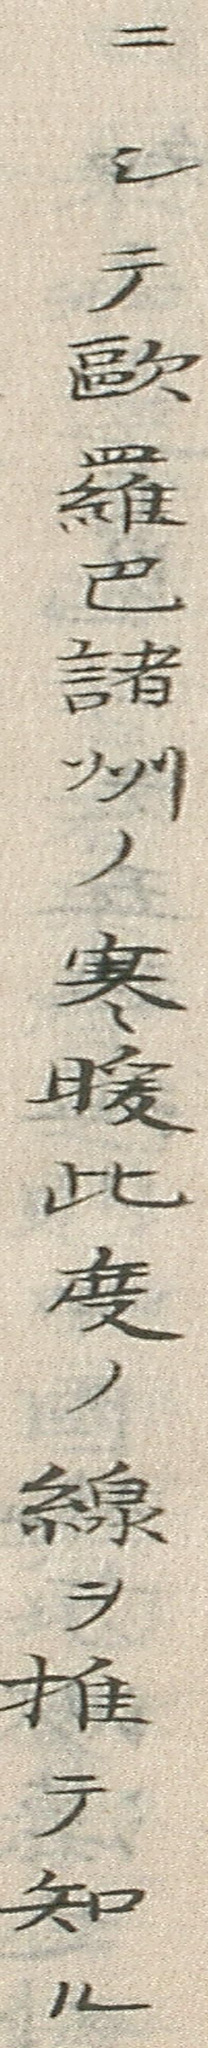ニシテ欧羅巴諸州ノ寒暖此度ノ線ヲ推テ知
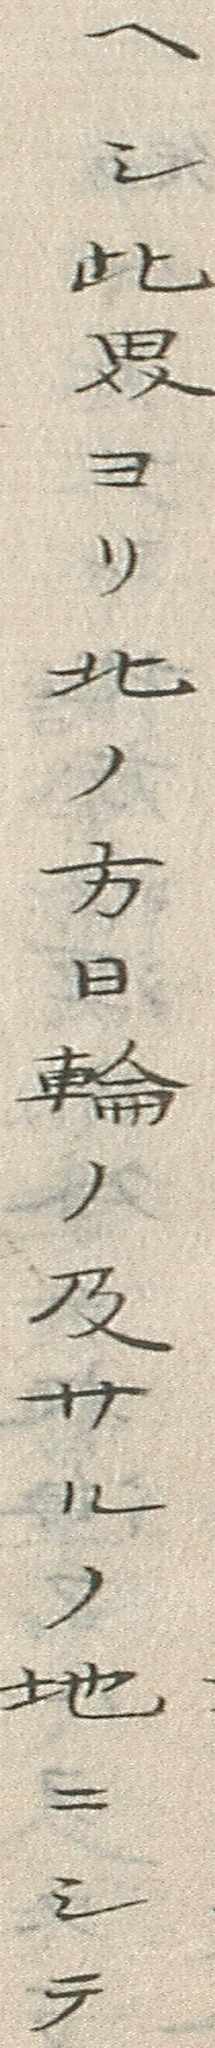ヘシ此界ヨリ北ノ方日輪ノ及サルノ地ニシテ
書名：天學略名目羽翼　全
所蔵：東京大学地震研究所図書室 Earthquake Research Institute Library, The University of Tokyo, JAPAN
